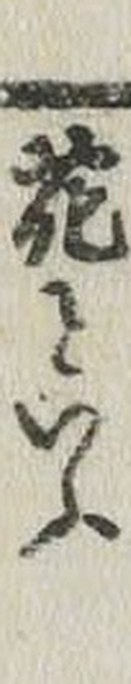花といふ

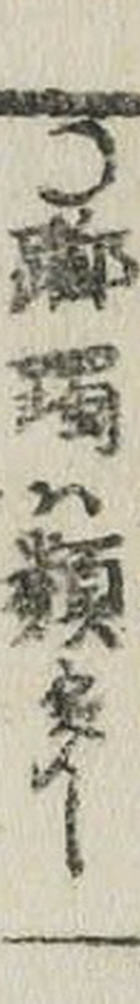○躑躅は類多し
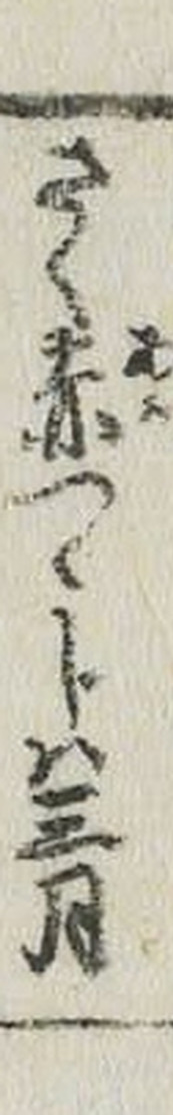さく赤つゝじは三月
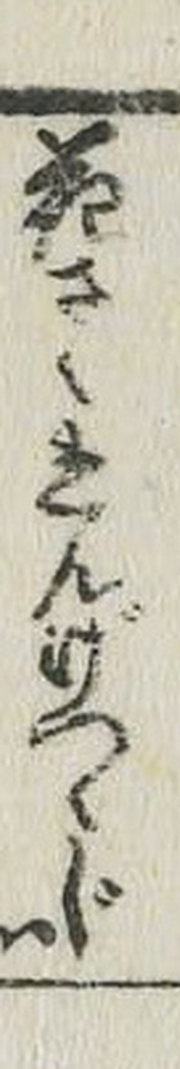花さくれんげつゝじは
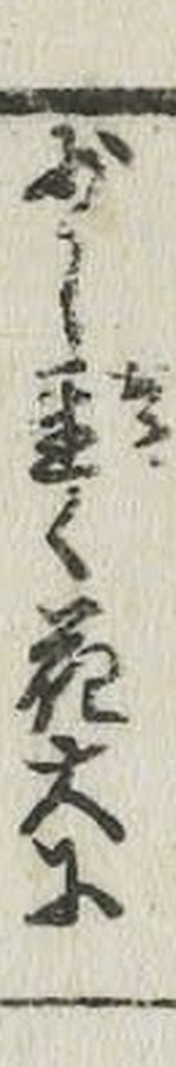少し遅く花大に
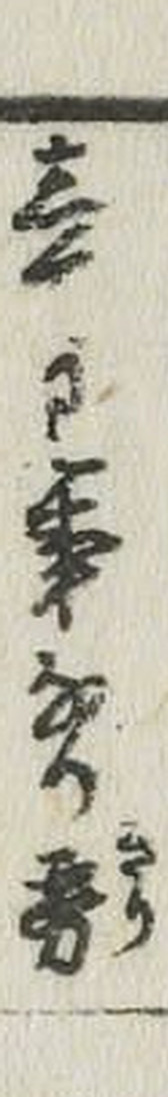して見事なり霧
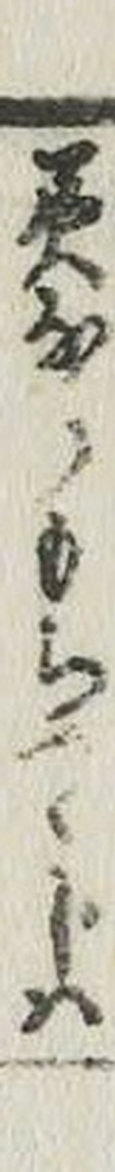美なりもちつゝじは
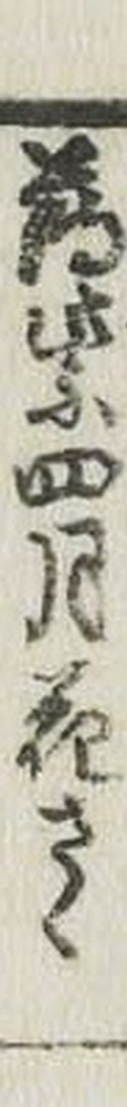薄紫四月花さく
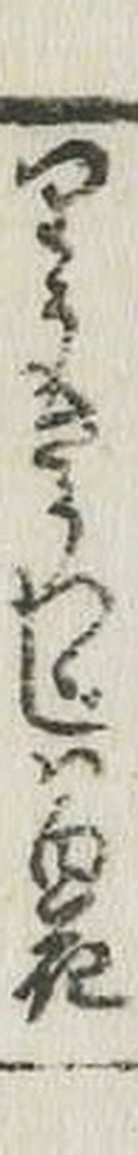りうきうつゝじは白花
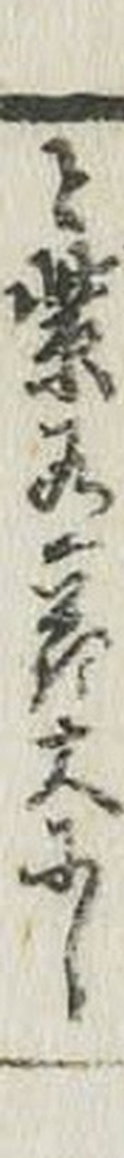と紫の花大にし
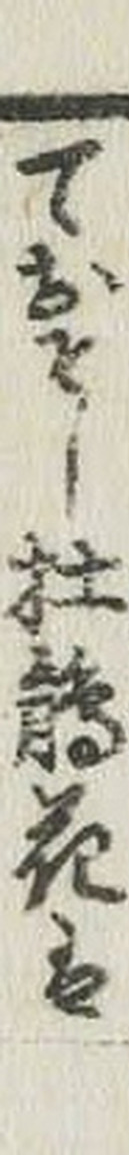ておそし杜鵑花は
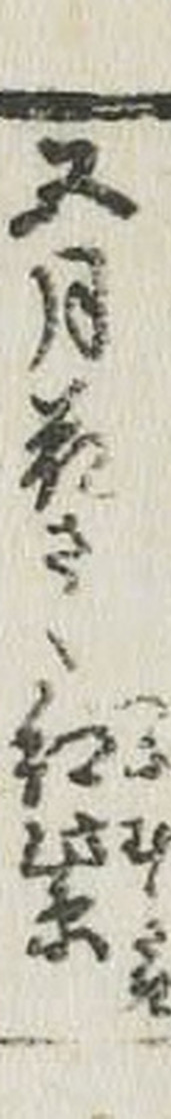五月花さく紅紫
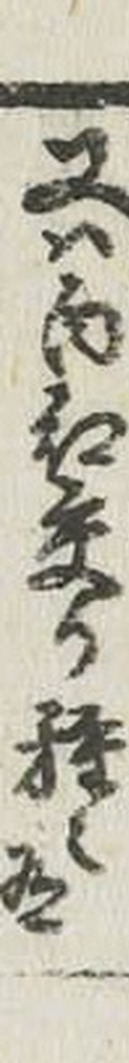又は白紅交り種々有
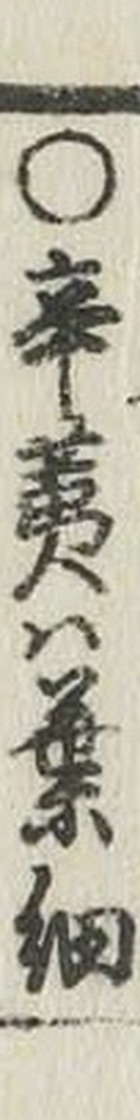○辛荑は葉細
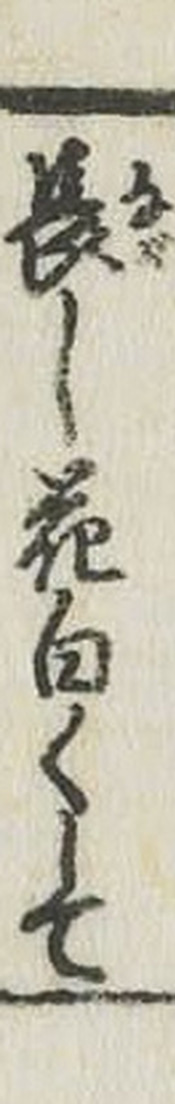長し花白くして
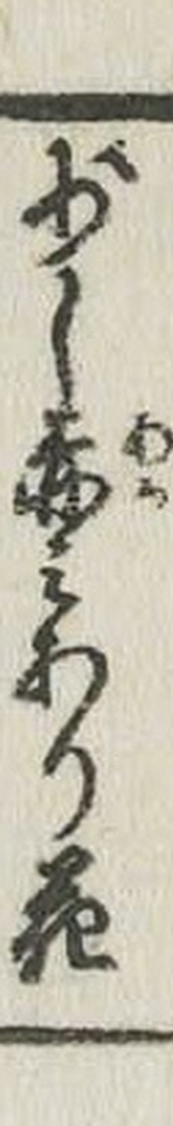少し赤みあり花
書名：増補頭書訓蒙図彙大成 10巻 8:巻之17-19
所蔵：東京学芸大学教育コンテンツアーカイブ
